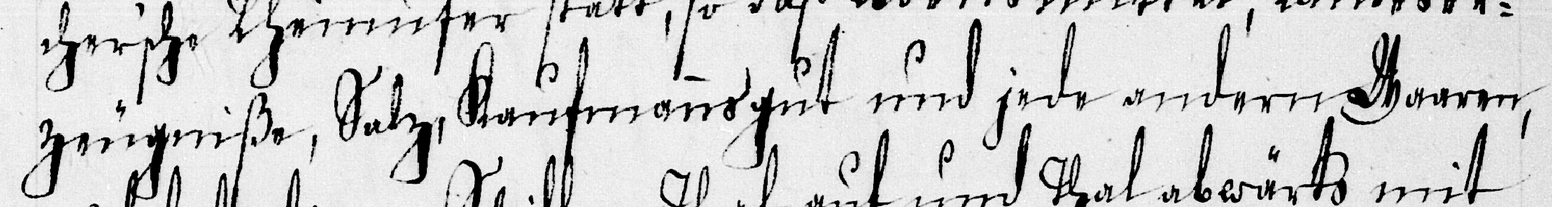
zeugniße, Salz, Kaufmannsgut und jede andern Waaren,
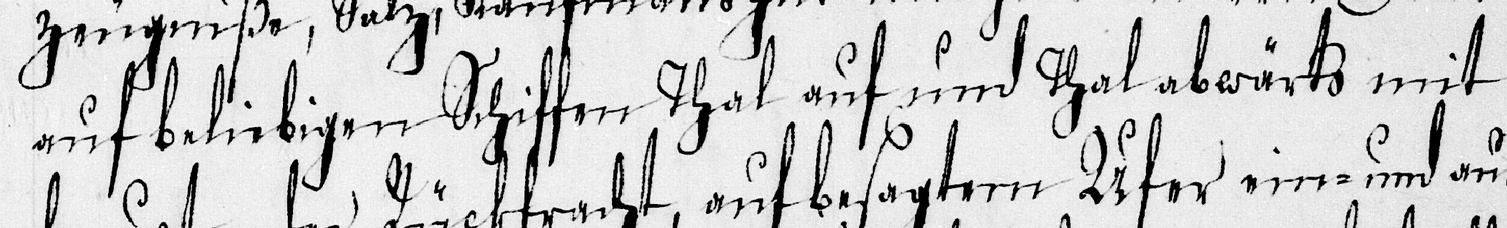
auf beliebigen Schiffen Thal auf und Thal abwärts mit
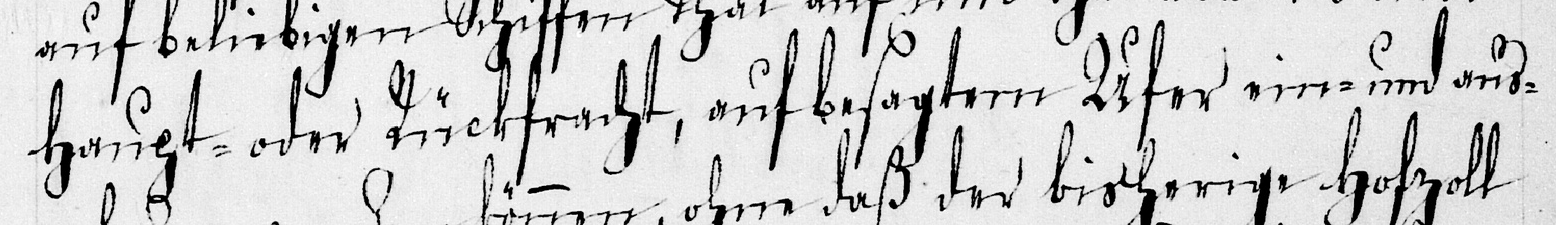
Haupt- oder Rückfracht, auf besagtem Ufer ein- und aus¬
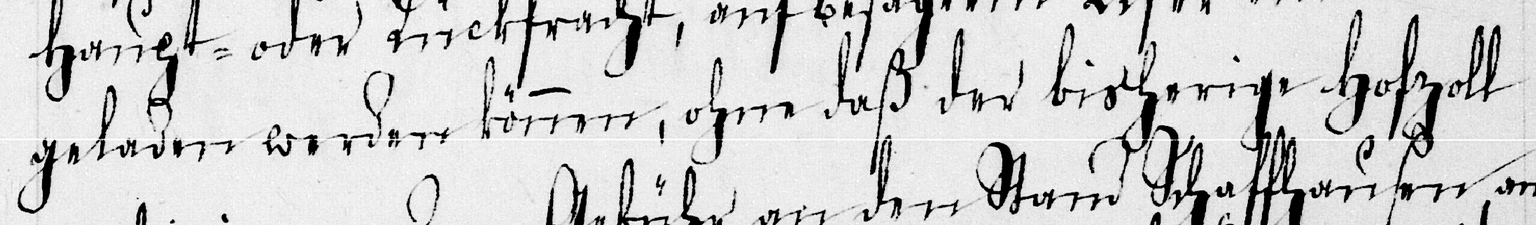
geladen werden können, ohne daß der bisherige Hofzoll
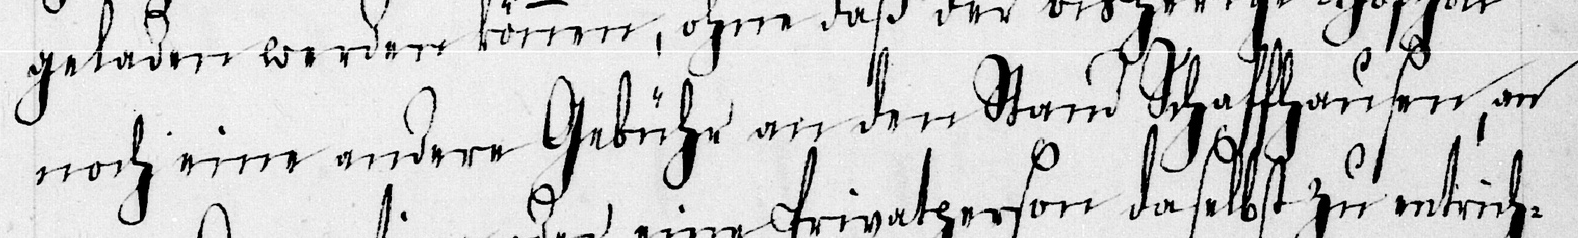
noch eine andere Gebühr an den Stand Schaffhausen, an
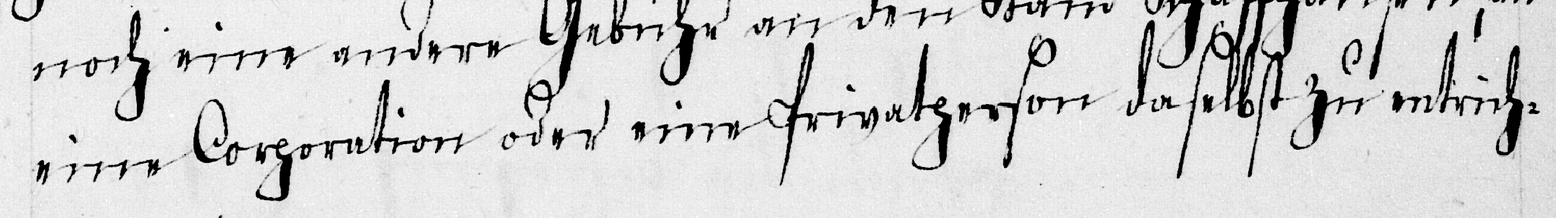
eine Corporation oder eine Privatperson daselbst zu entrich¬
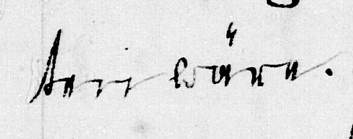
ten wäre.
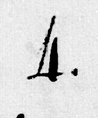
4.
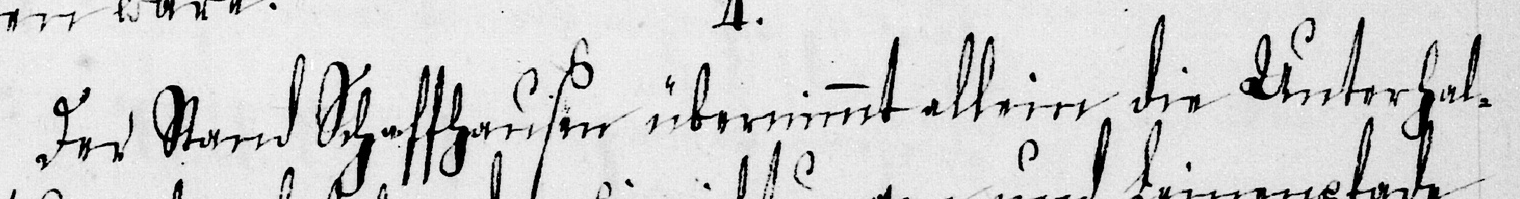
Der Stand Schaffhausen übernimmt allein die Unterhal¬
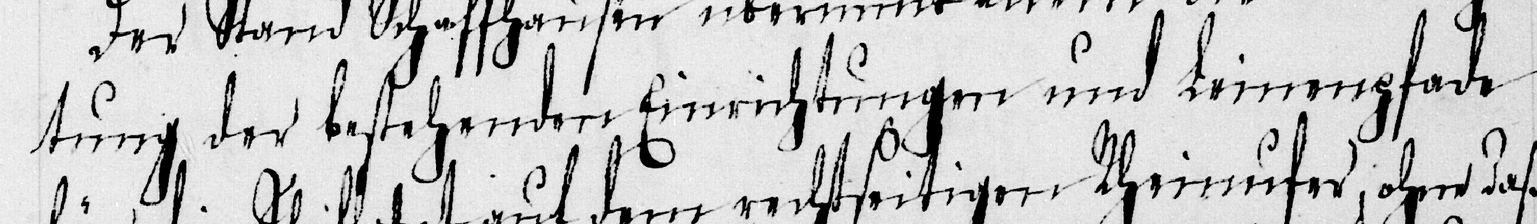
tung der bestehenden Einrichtungen und Leinenpfade
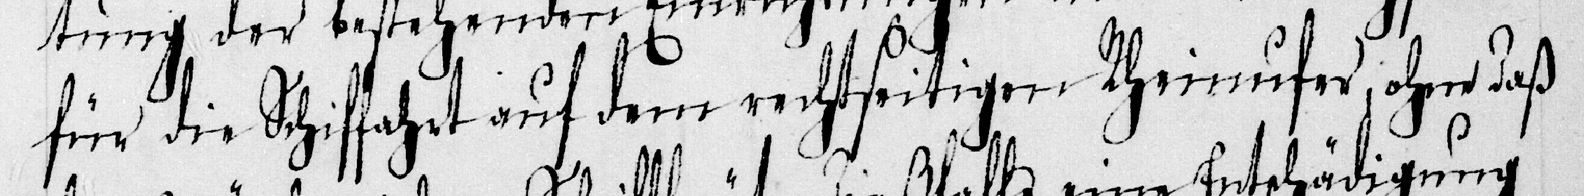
für die Schiffahrt auf dem rechtseitigen Rheinufer, ohne daß
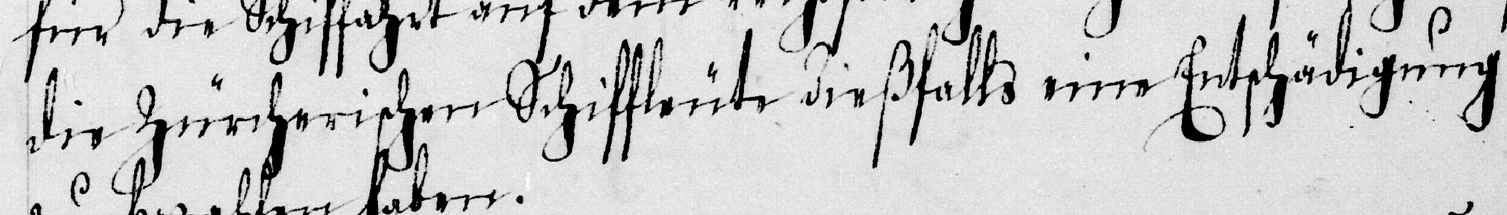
die Zürcherischen Schiffleute diesßfalls eine Entschädigung
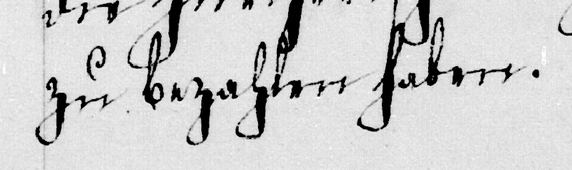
zu bezahlen haben.
